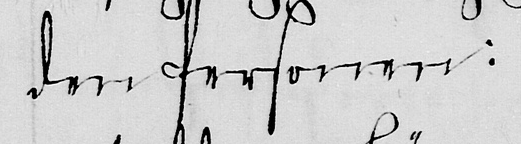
den Personen:
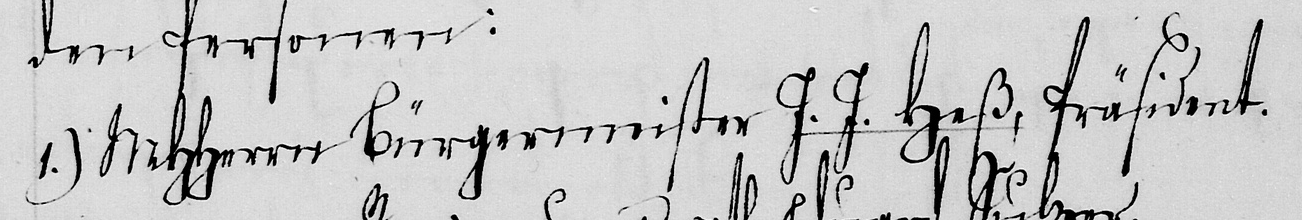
1.) MHHerrn Bürgermeister J. J. Heß, Präsident.
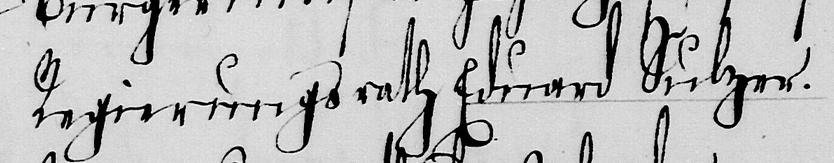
Regierungsrath Eduard Sulzer.
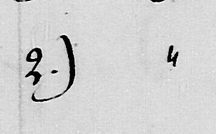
2.)
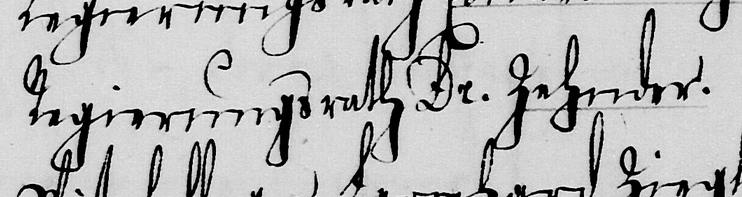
Regierungsrath Dr. Zehnde¬
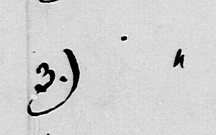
3.)
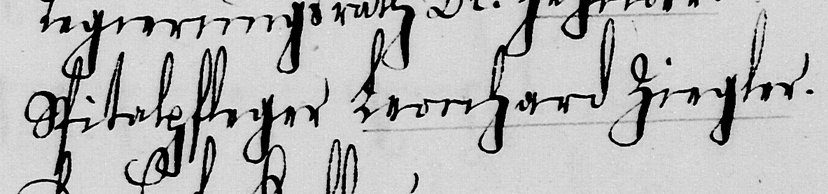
Stiftspfleger Leonhard Ziegler.
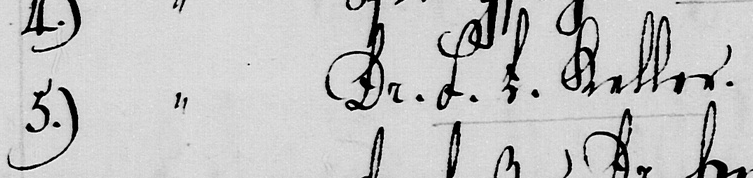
5.) “ Dr. F. L. Keller.
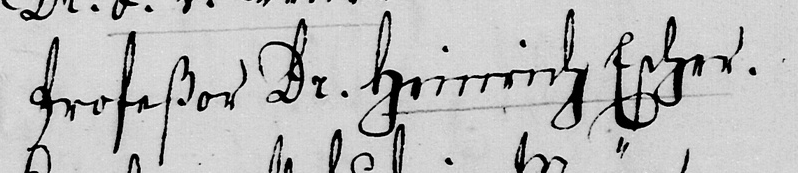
Profeßor Dr. Heinrich Escher.
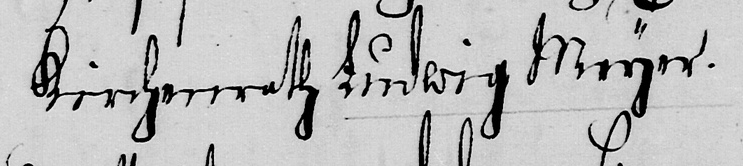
Kirchenrath Ludwig Meyer.
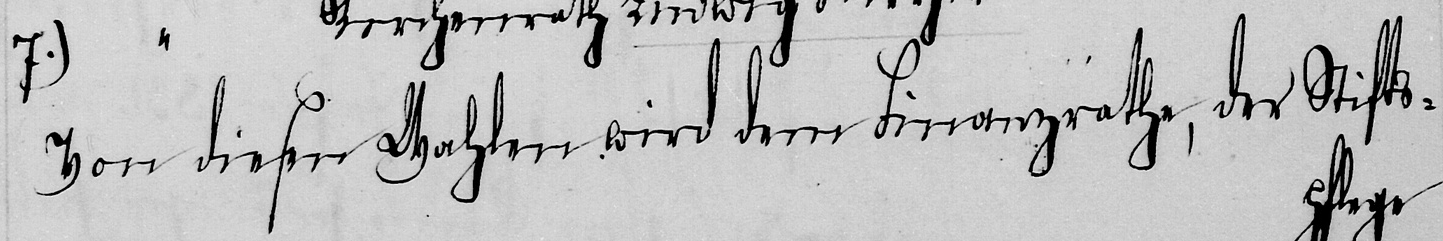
Von diesen Wahlen wird dem Finanzrathe, der Sti¬
